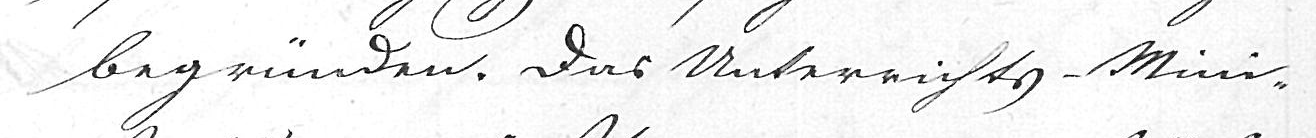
begründen. Das Unterrichts-Mini-
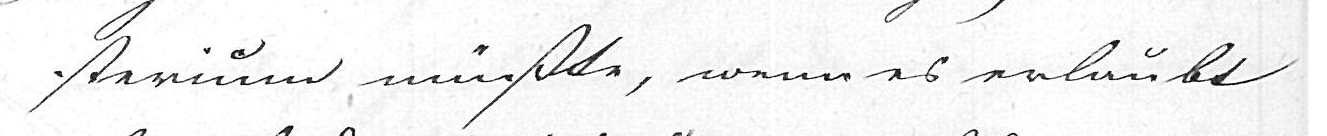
sterium müßte, wenn es erlaubt
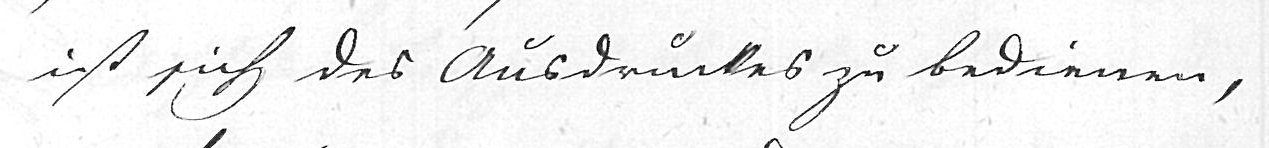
ist sich des Ausdruckes zu bedienen,
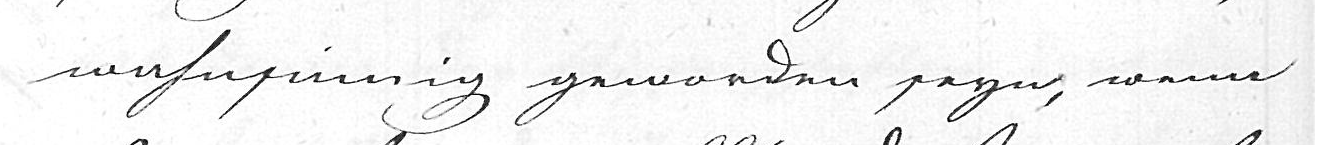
wahnsinnig geworden seyn, wenn
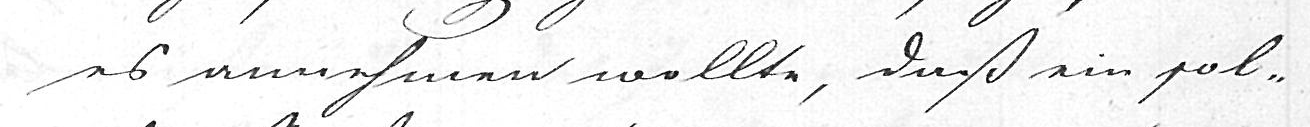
es annehmen wollte, daß ein sol-
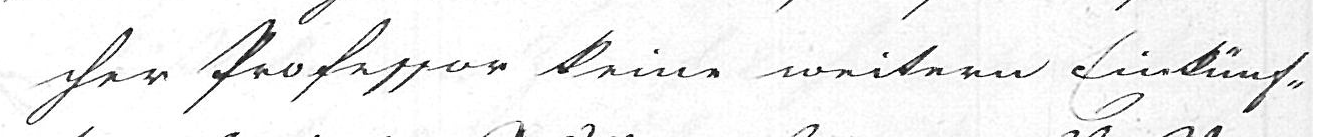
cher Professor keine weitern Einkünf-
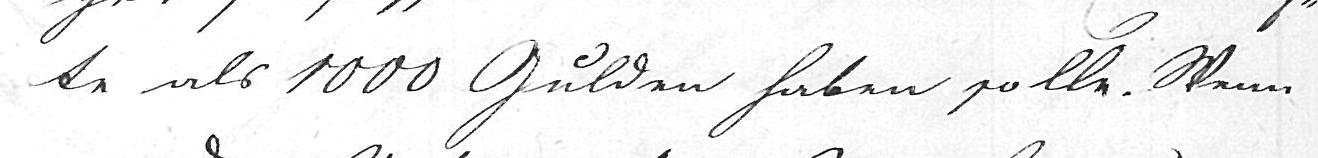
te als 1000 Gulden haben solle. Wenn
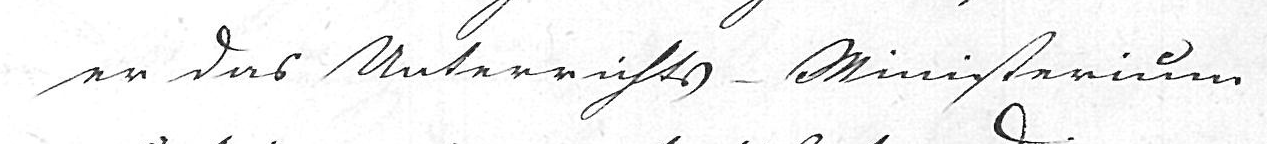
er das Unterrichts-Ministerium
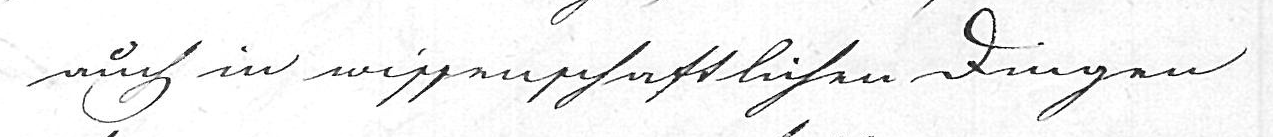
auch in wissenschaftlichen Dingen
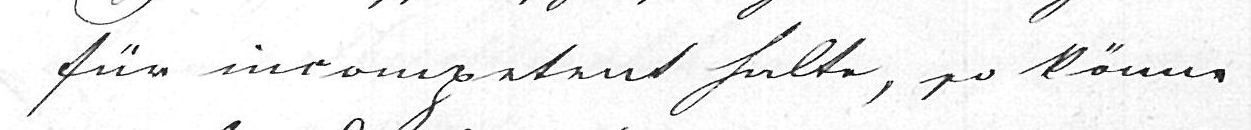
für incompetent halte, so könne
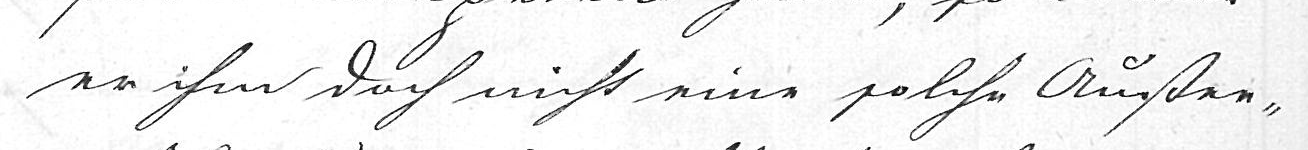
er ihm doch nicht eine solche Außer-
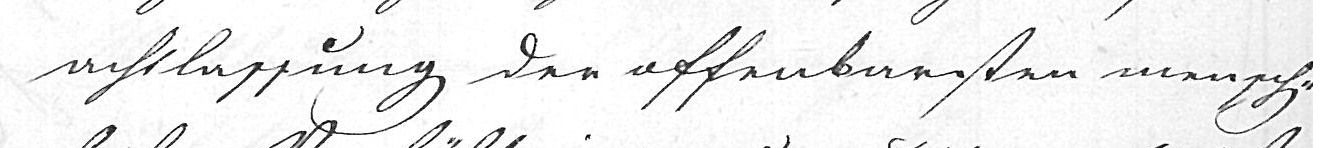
achtlassung der offenbarsten mensch-
